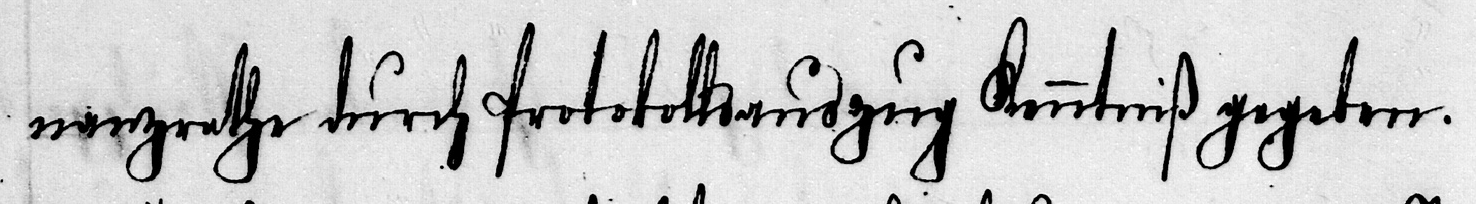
nanzrathe durch Protokollsauszug Kenntniß gegeben.
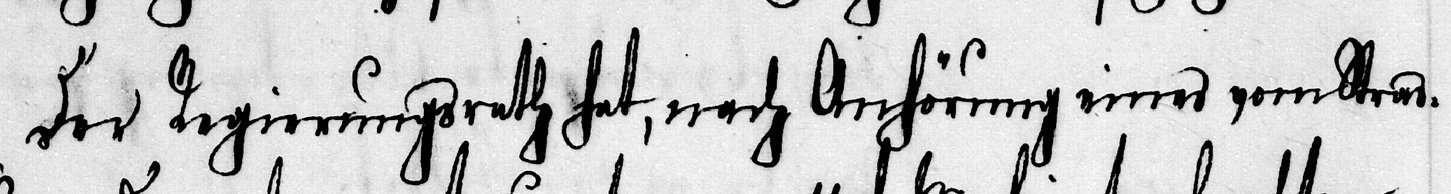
Der Regierungsrath hat, nach Anhörung eines vom Straß¬
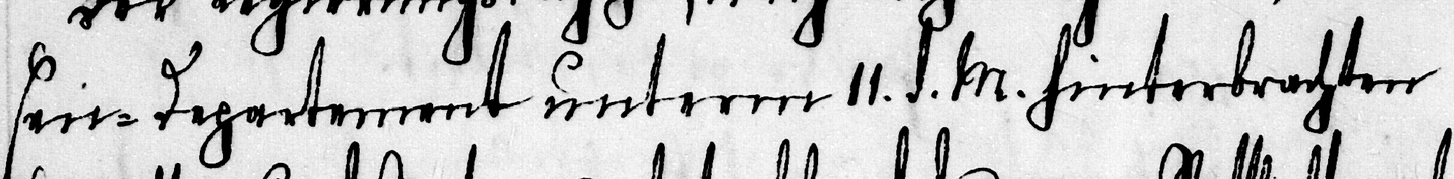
en-Departement unterm 11. d. M. hinterbrachten
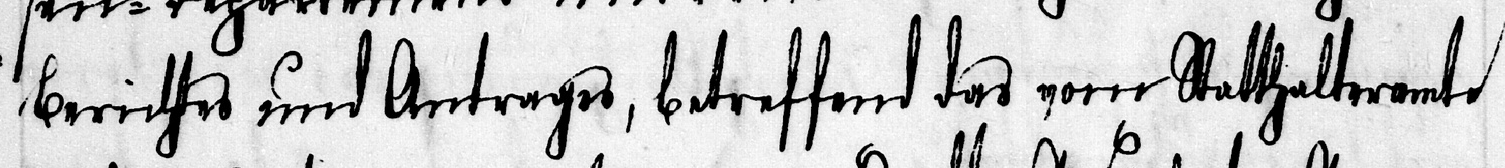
Berichtes und Antrages, betreffend das vom Statthalteramte
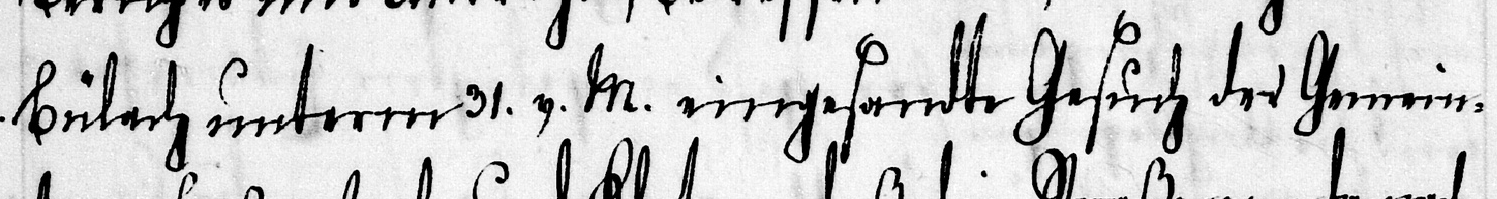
Bülach unterm 31. v. M. eingesandte Gesuch der Gemein¬
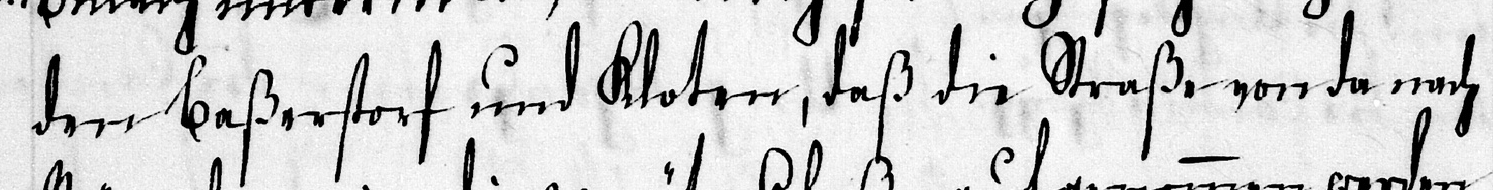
den Baßerstorf und Kloten, daß die Straße von da nach
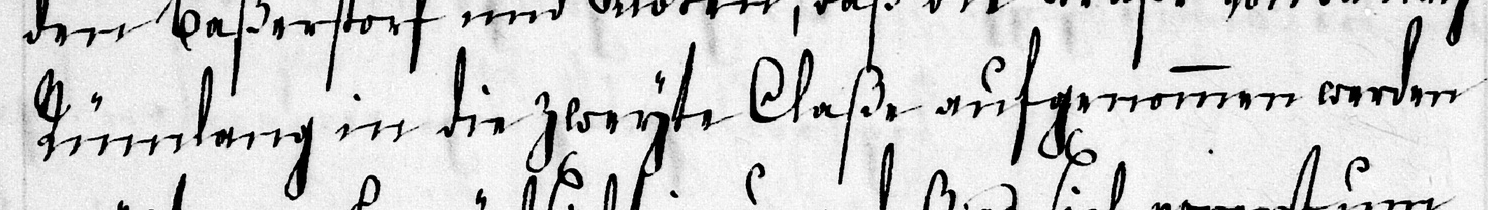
Rümlang in die zweyte Claße aufgenommen werden
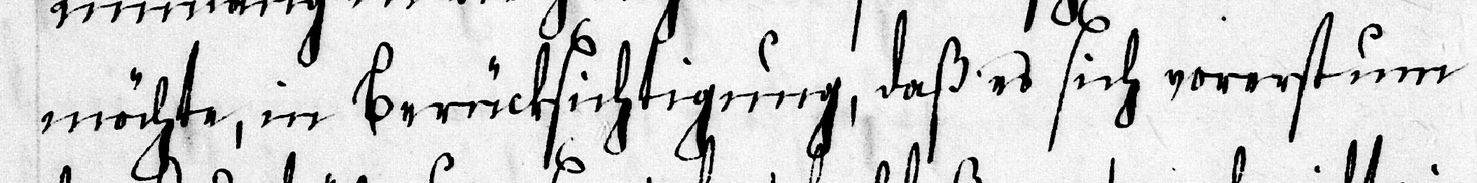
möchte, in Berücksichtigung, daß es sich vorerst um
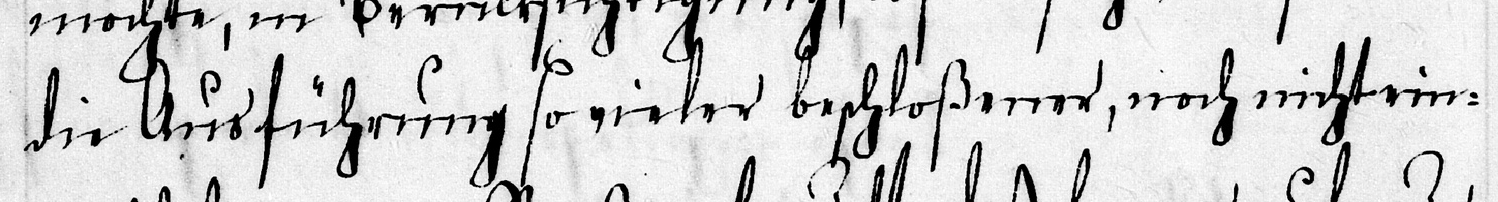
die Ausführung so vieler beschloßener, noch nicht ein¬
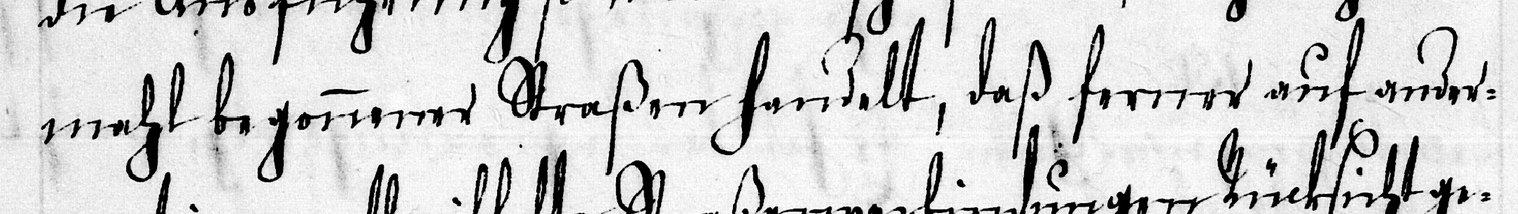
mahl begonnener Straßen handelt, daß ferner auf ander¬
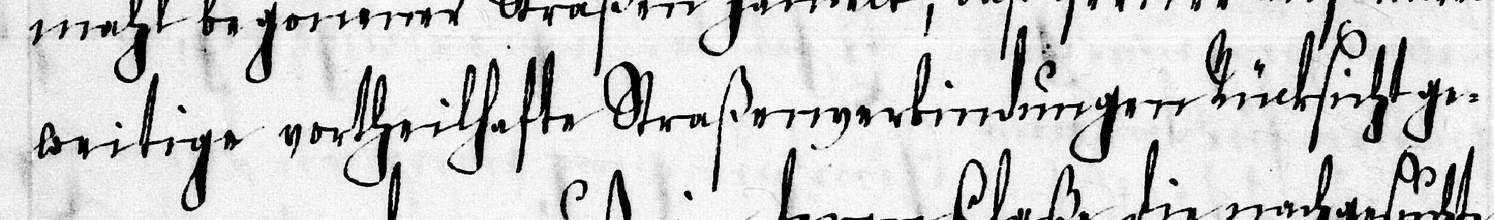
weitige vortheilhafte Straßenverbindungen Rücksicht g¬
